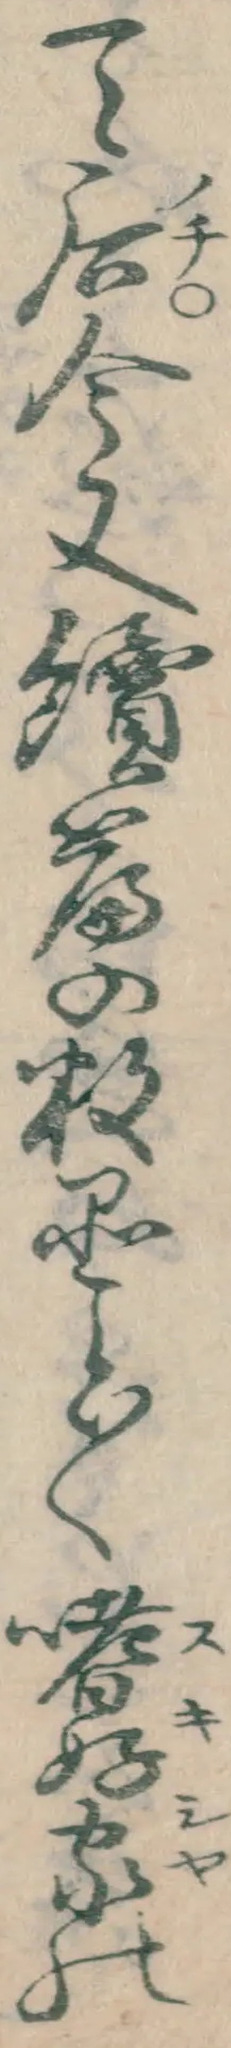て后。今又続篇の数品こと〳〵嗜好家の
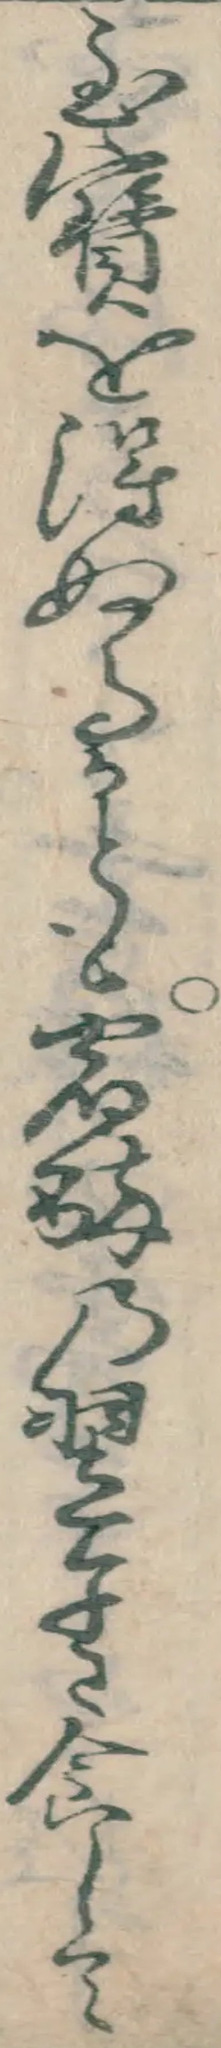至宝を得ぬるかとも。宿酔の翌午に食して
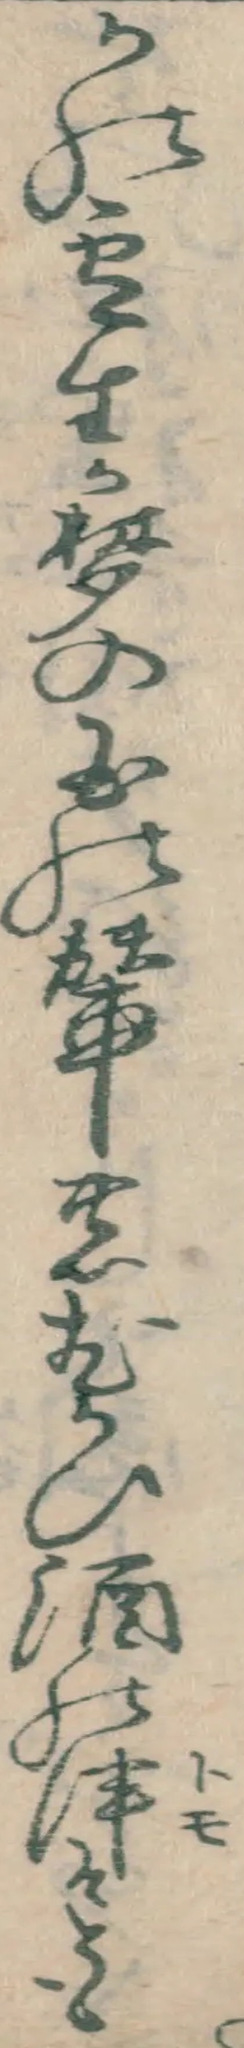かの雲生か夢の国の輦のむかひ酒の伴そとも。

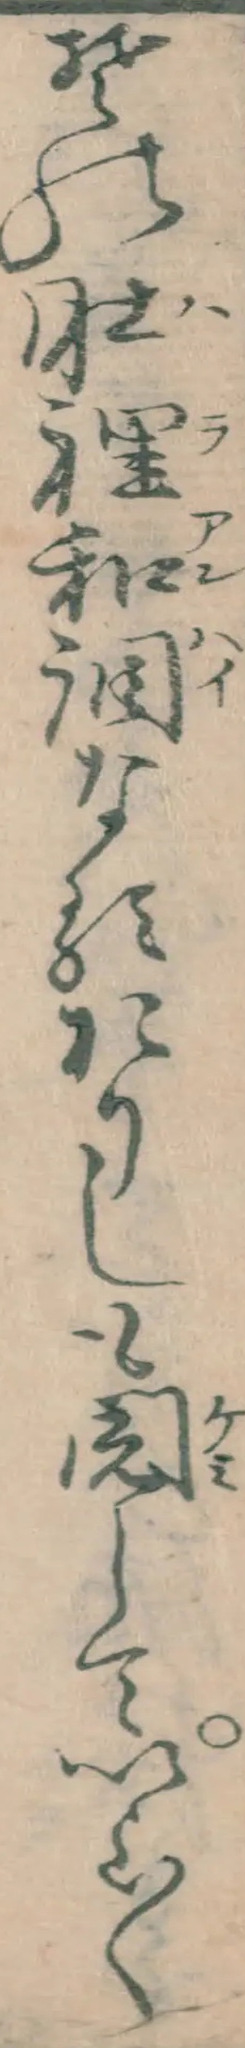その肚裏和調なるおりしも閲して。いよ〳〵
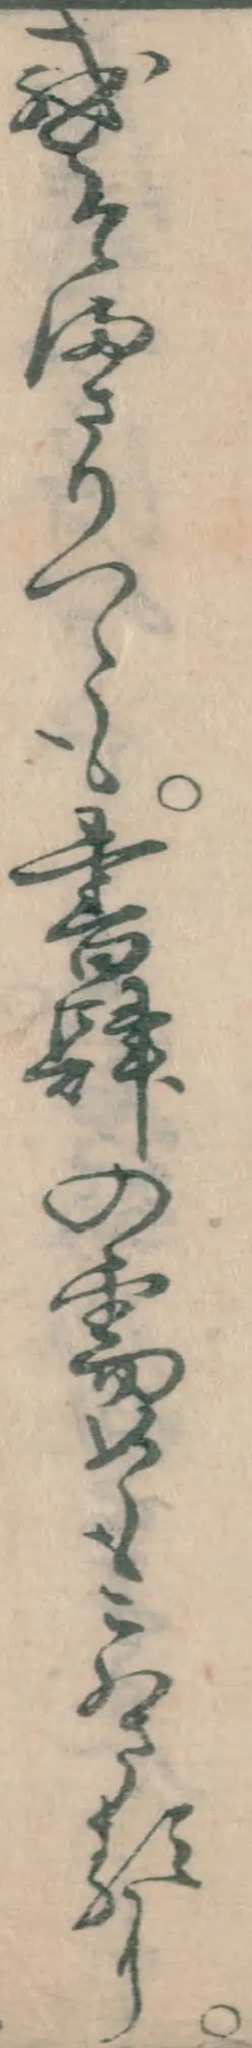感そまさりつゝも。書肆の需めもこはさるに。
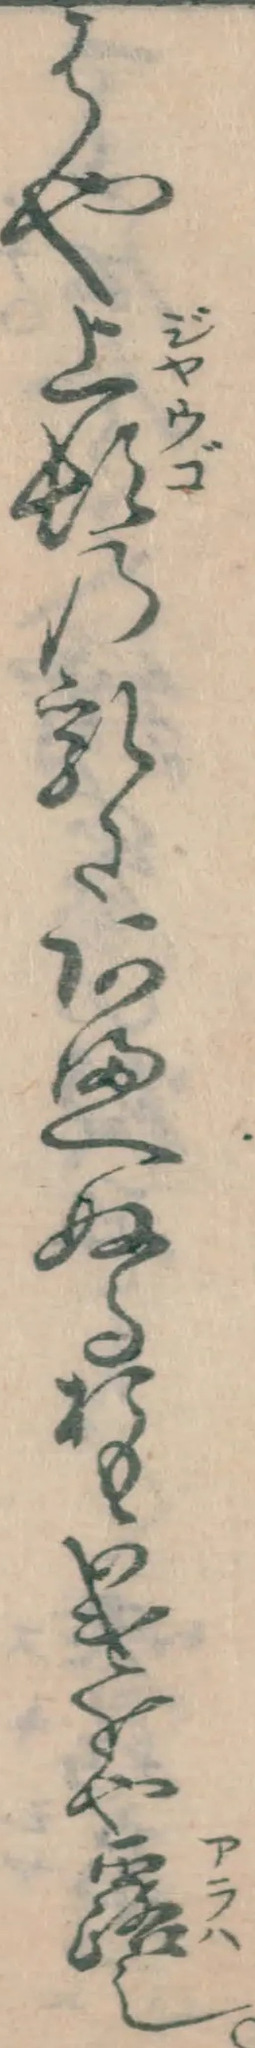はや上頓の乳にあまへぬるおもかけをや露し。
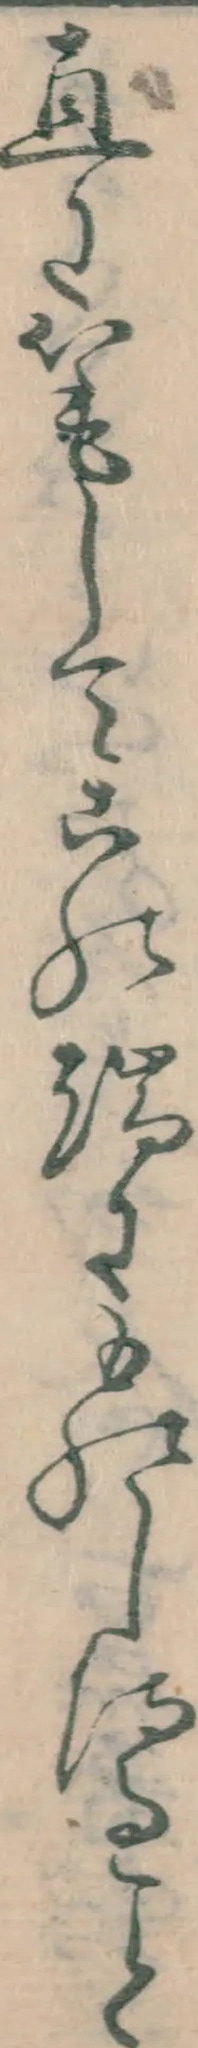直に筆してこの端にものし侍ること
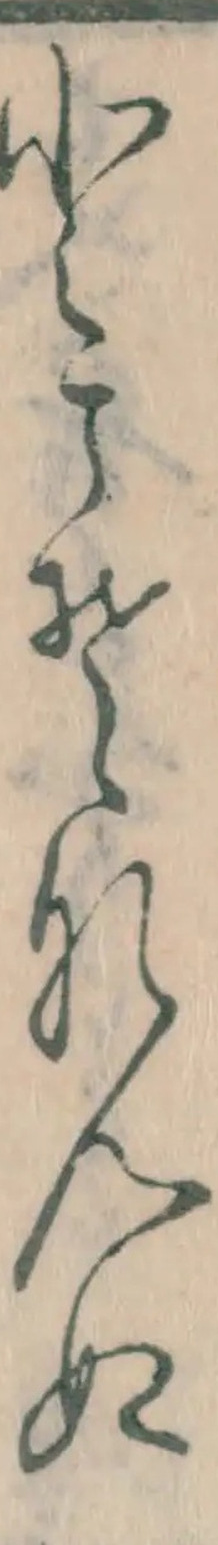とこそなんぬ
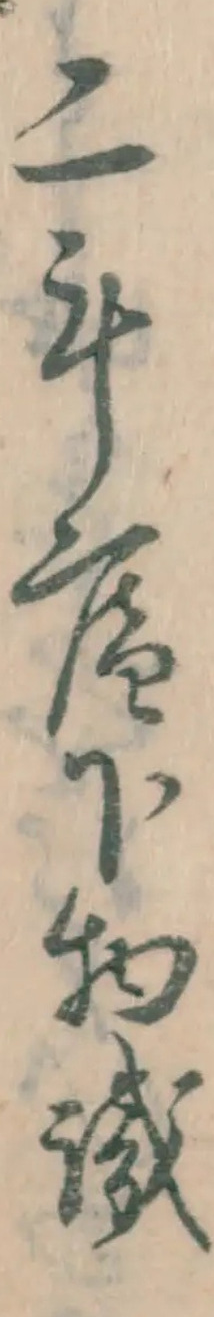二斗庵下物識
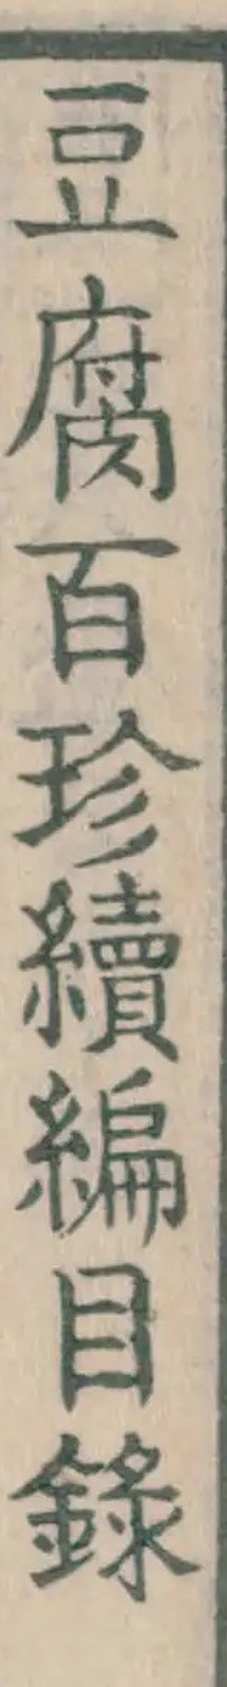豆腐百珍続編目録
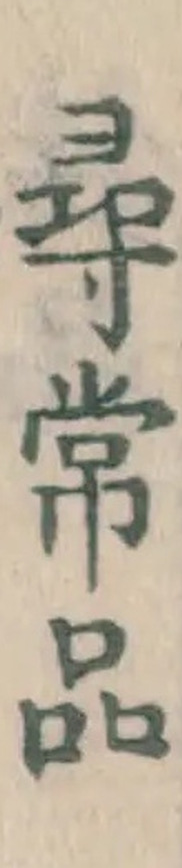尋常品

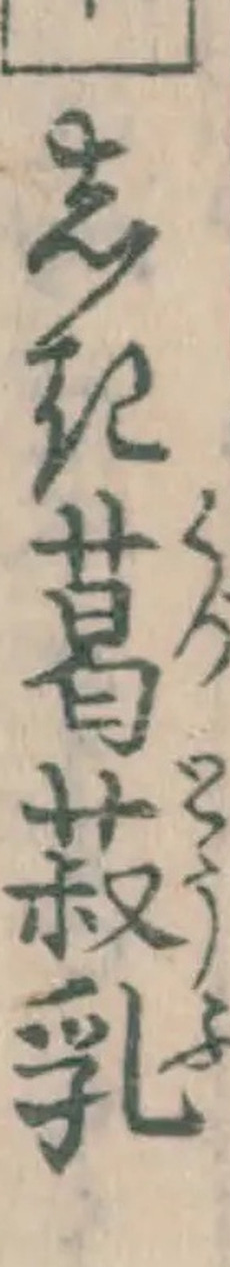二十しき葛菽乳

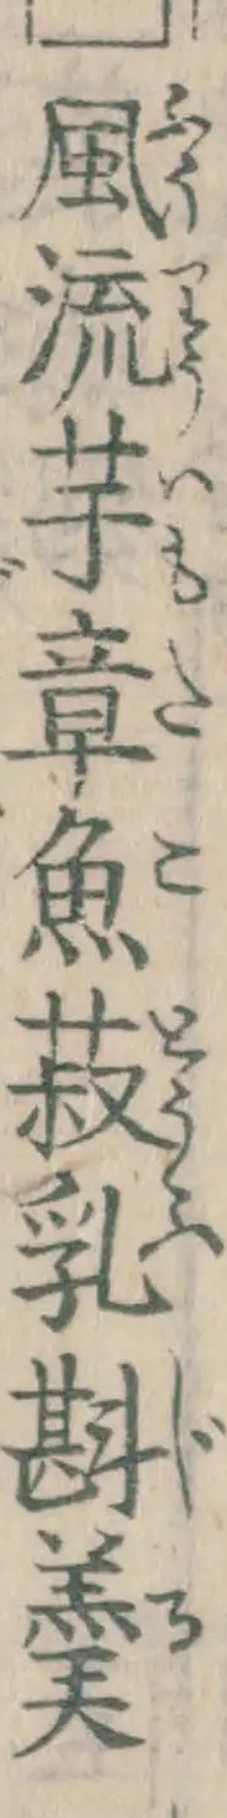一風流芋章魚菽乳斟羹

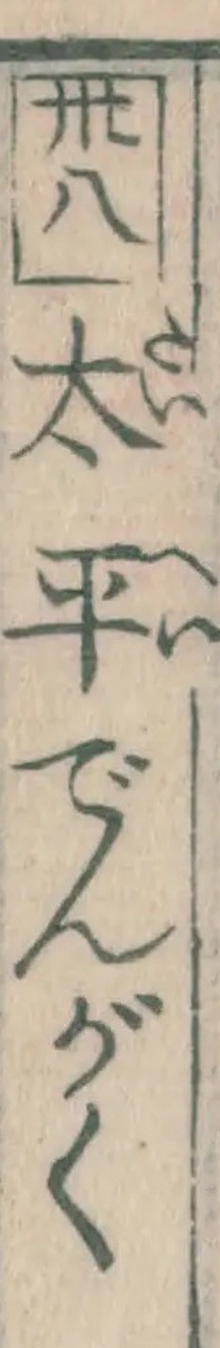卅八太平でんがく
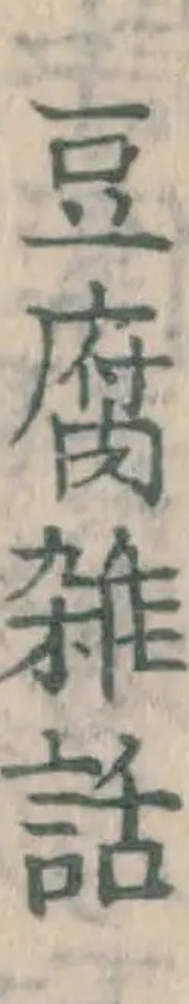豆腐雑話
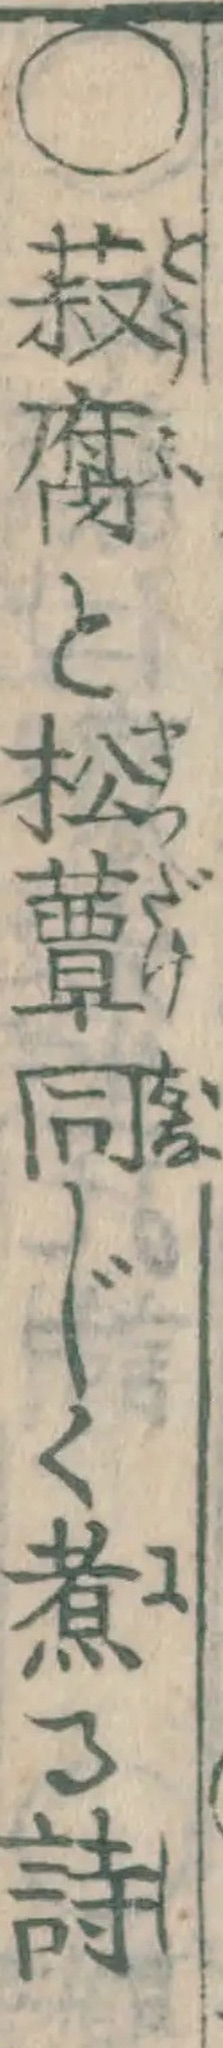○菽腐と松蕈同じく煮る詩
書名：豆腐百珍. 続編
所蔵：国立国会図書館 National Diet Library, JAPAN
